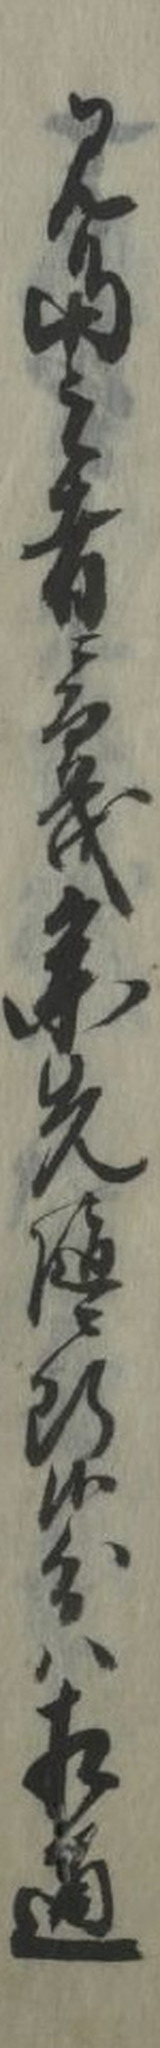見当之者に而も参先随に断候分は相通

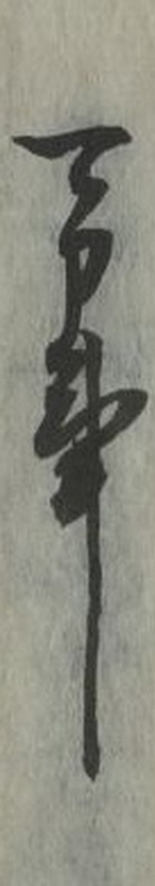可申事
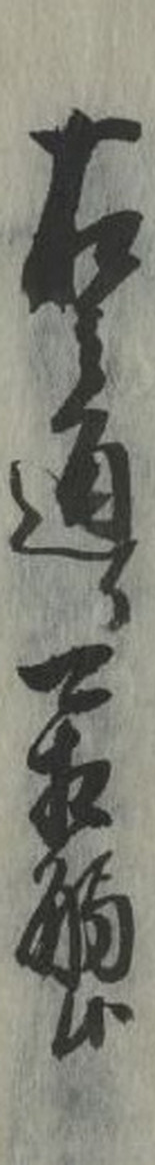右之通り可相触候
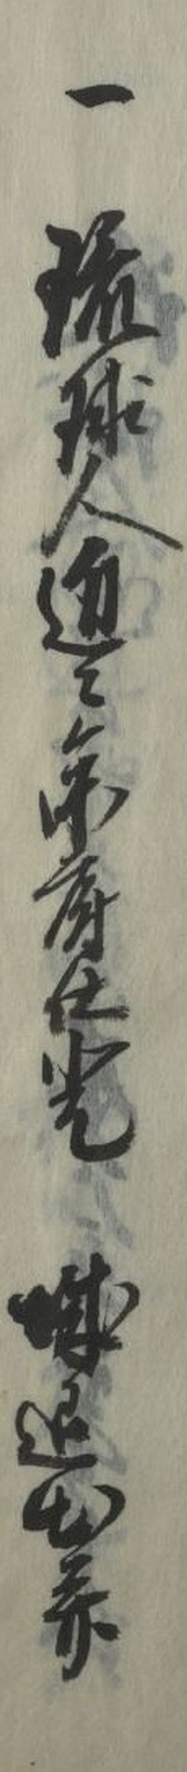一琉球人近々参府仕登城退出幷
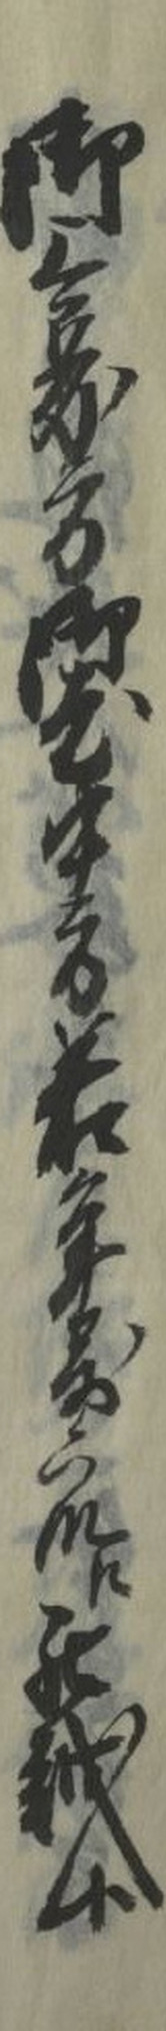御三家方御老方中若年寄衆え罷越候
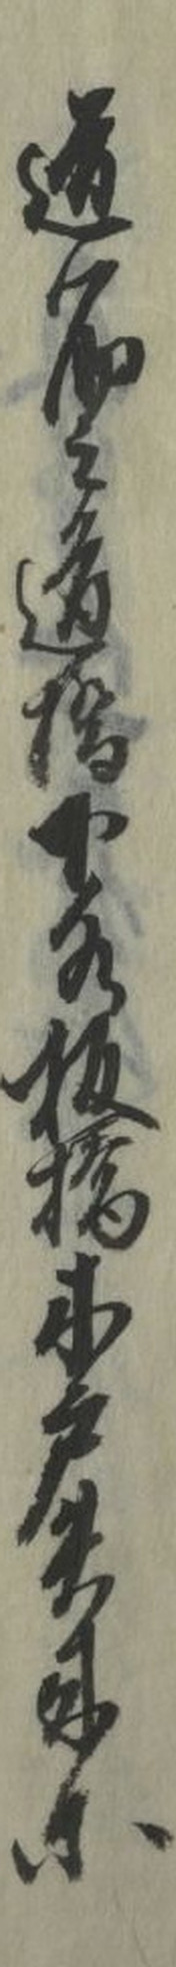道筋之道橋下水板橋木戸矢来等
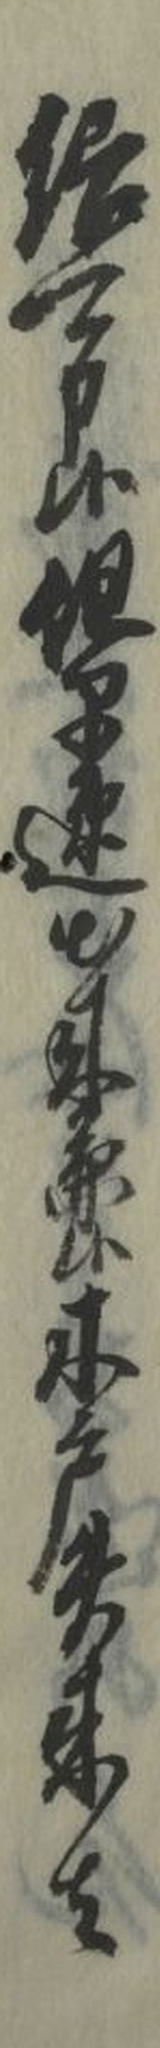繕可申候但早速出来兼候木戸矢来は
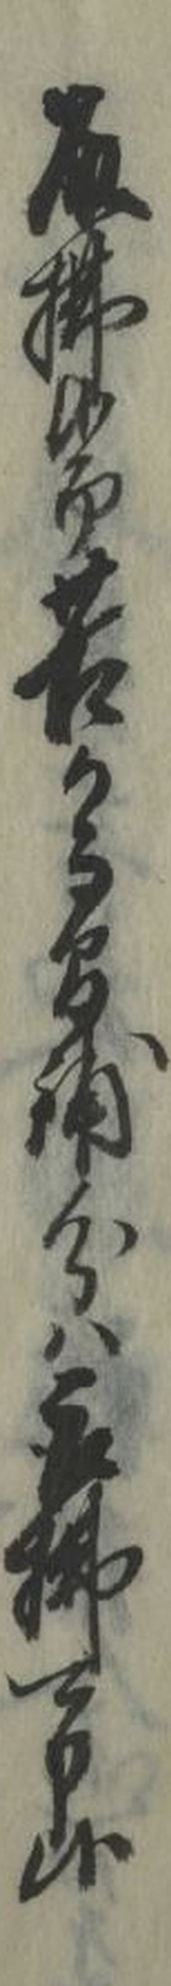取払候而苦かる間鋪分は取払可申候
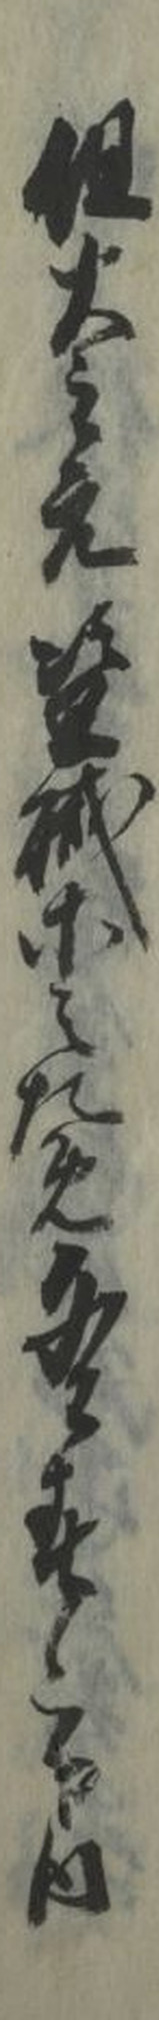但火之元盗賊等之ため冬春と申内

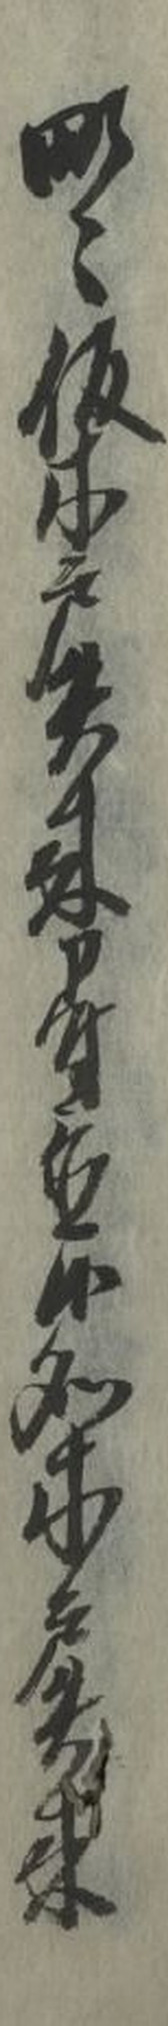町々仮木戸矢来申付置候処木戸矢来
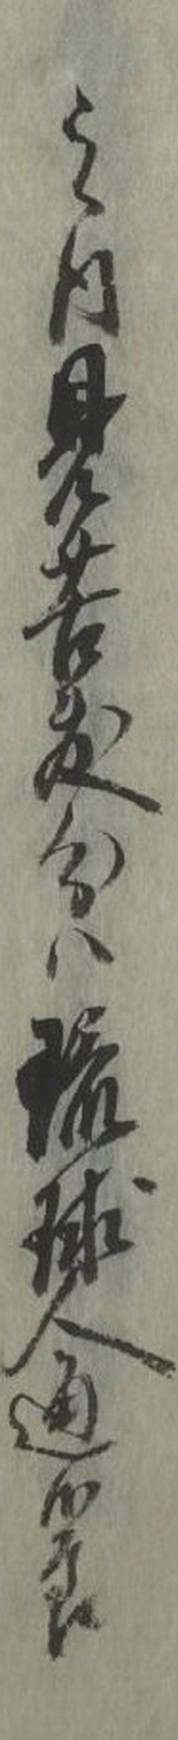之内見苦敷分は琉球人通候節
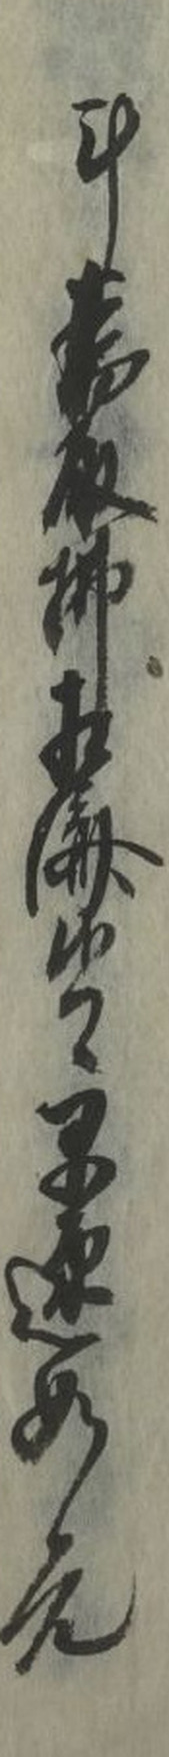計為取払相済候はゝ早速如元
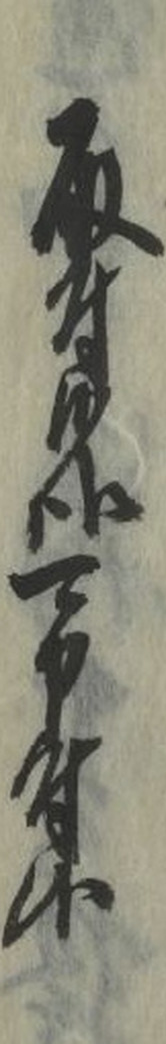取付候様可申付候
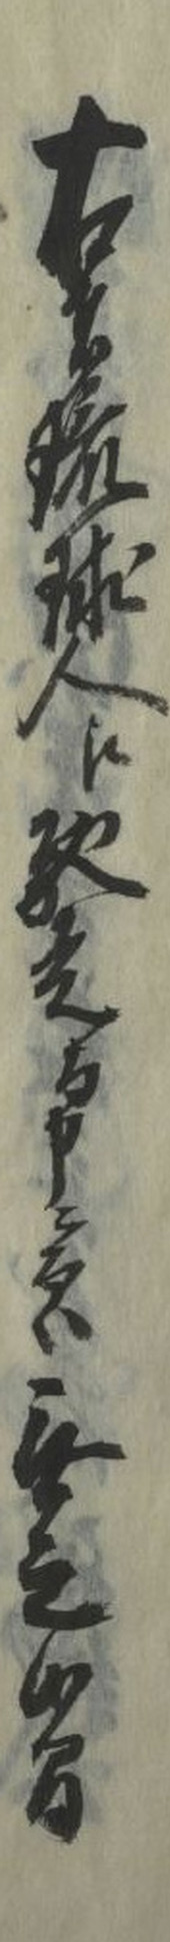右は琉球人え馳走と申に而は無之候間
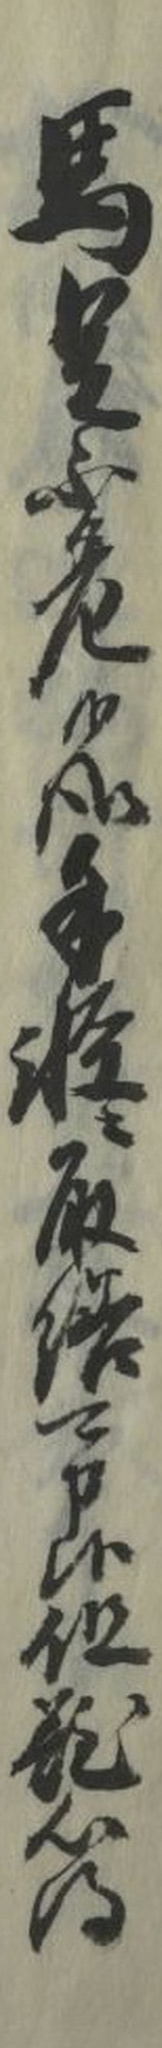馬足不危候様手軽に取繕可申候但難心得
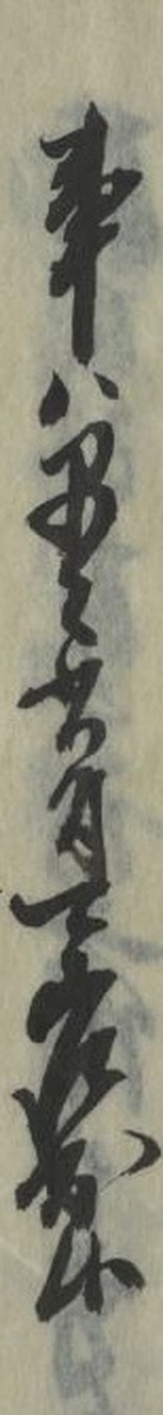事は早々書付可差出候
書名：天保三壬辰年・琉球人参府・弐朱吹立御触写
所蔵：University of the Ryukyus Library
